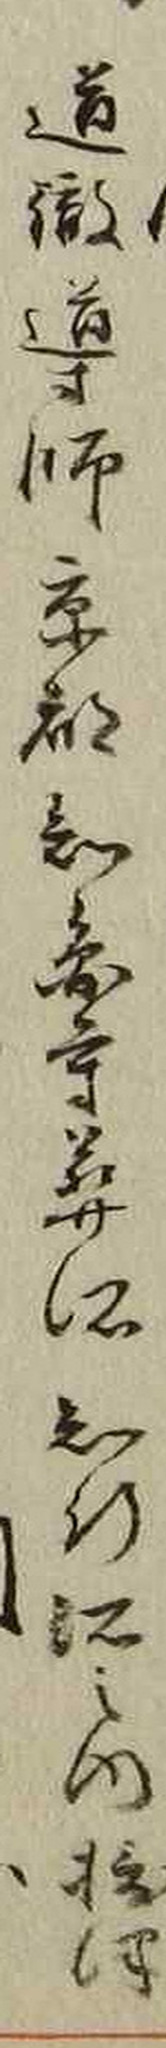道徹導師京都知円寺葬所知行所之内摂津
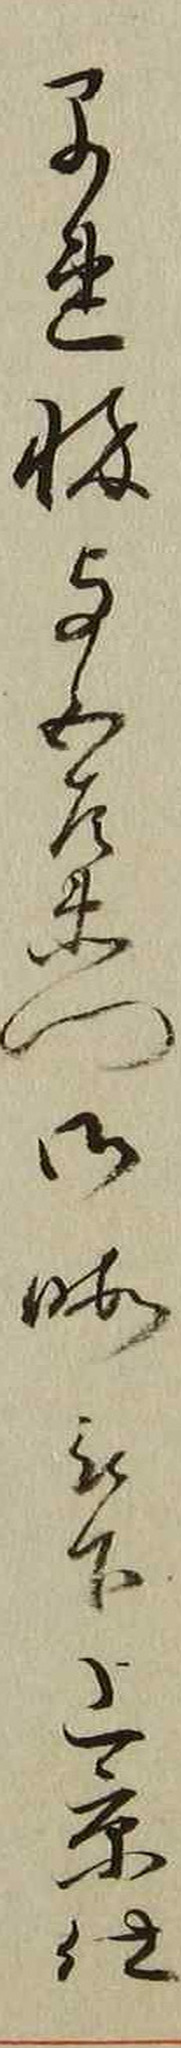早速忰与五左衛門御暇被下上京仕
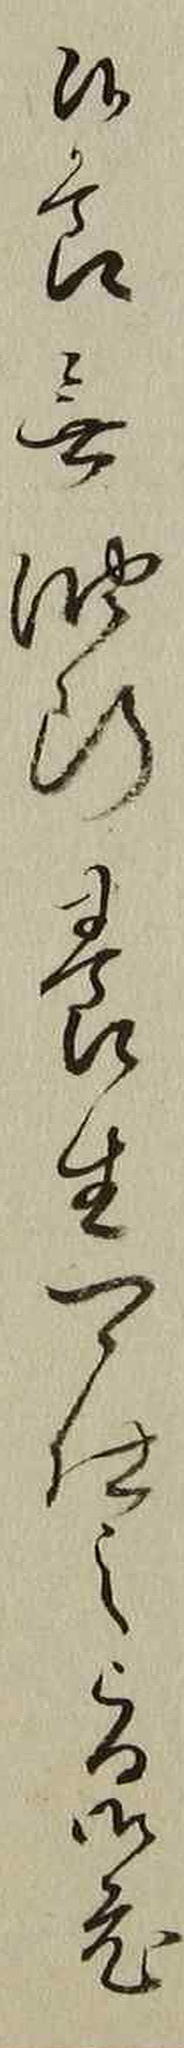候節無油断養生可仕之旨御老
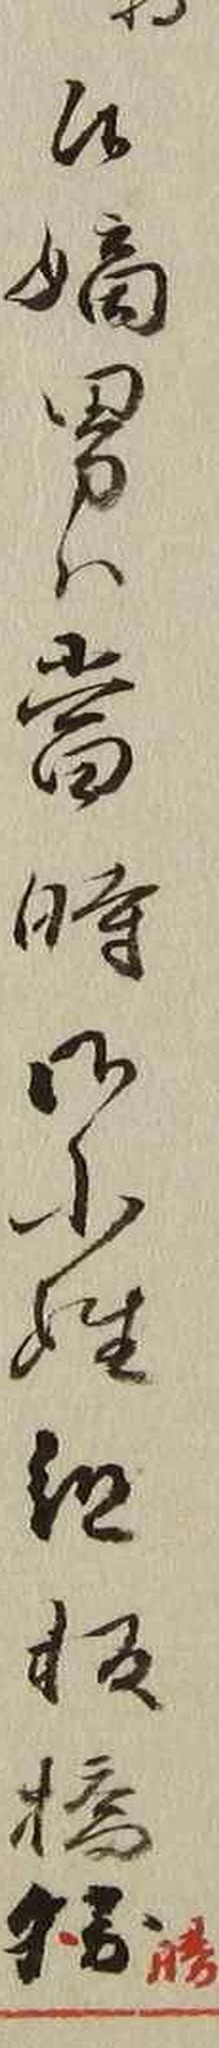仕候候嫡男ハ当時御小姓組板橋勝
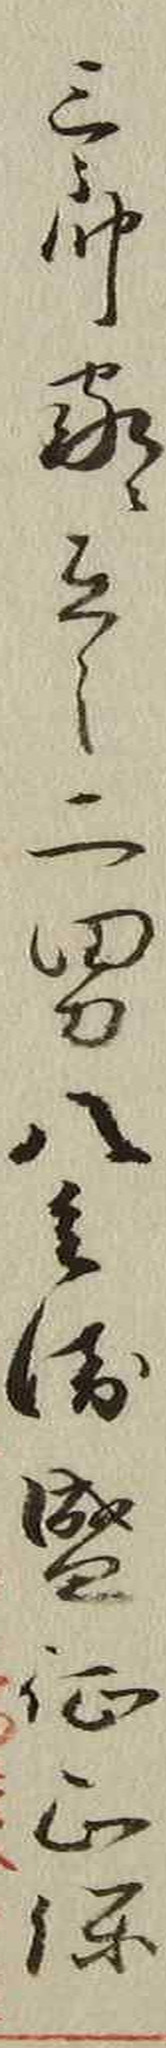三郎家ニ在之二男八兵衛盛征正保
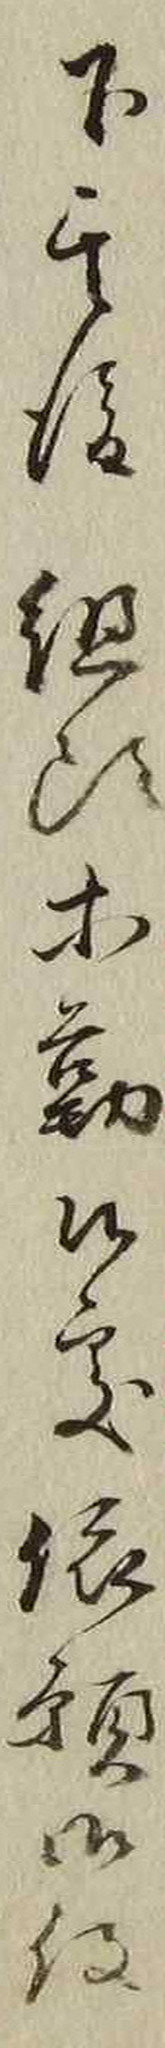下其後組頭等相勤候処依願御役
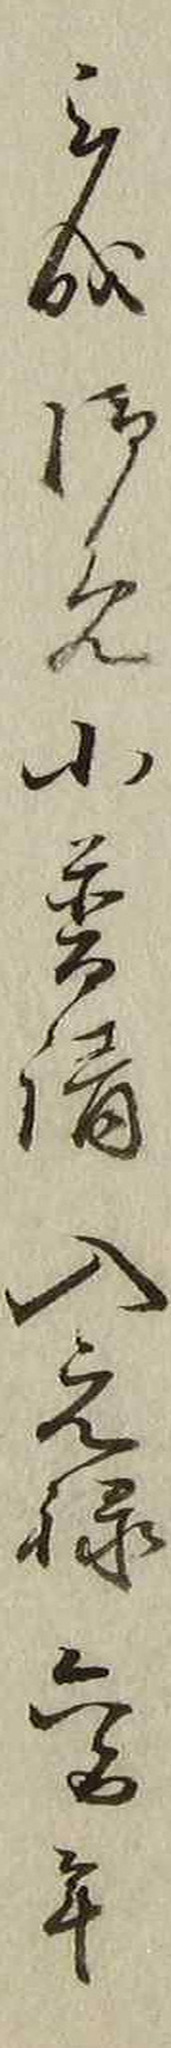被成御免小普請入元禄六酉年
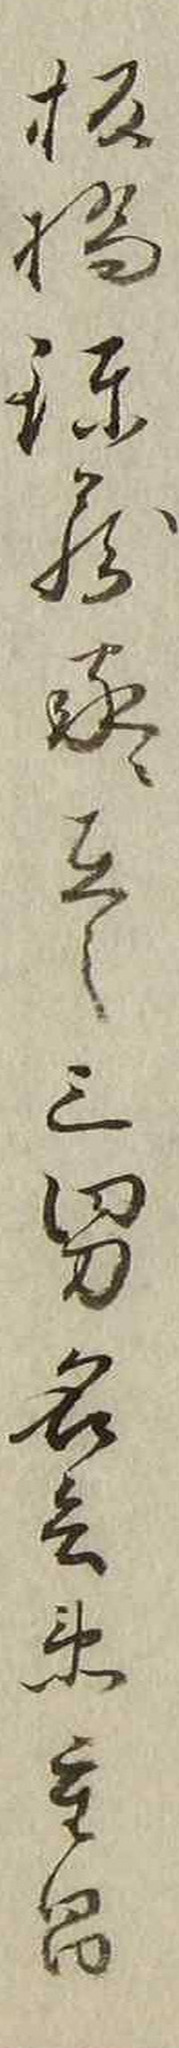板橋錬蔵家ニ在之三男名兵衛重昌
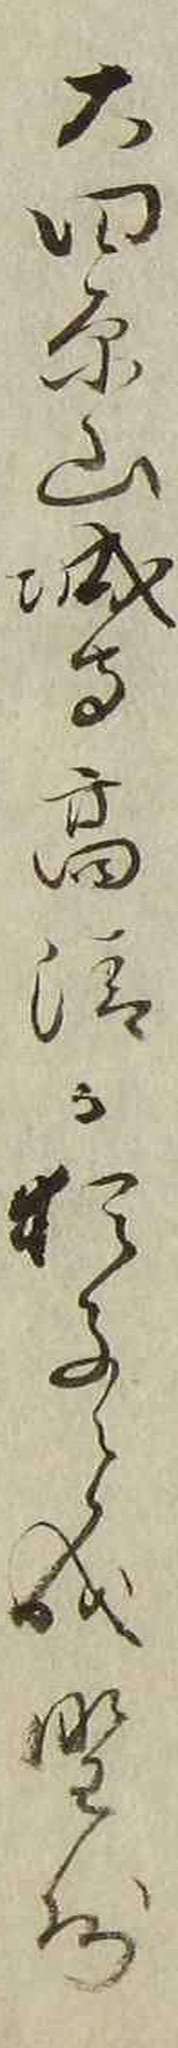大田原山城守高清か猶子と成野州

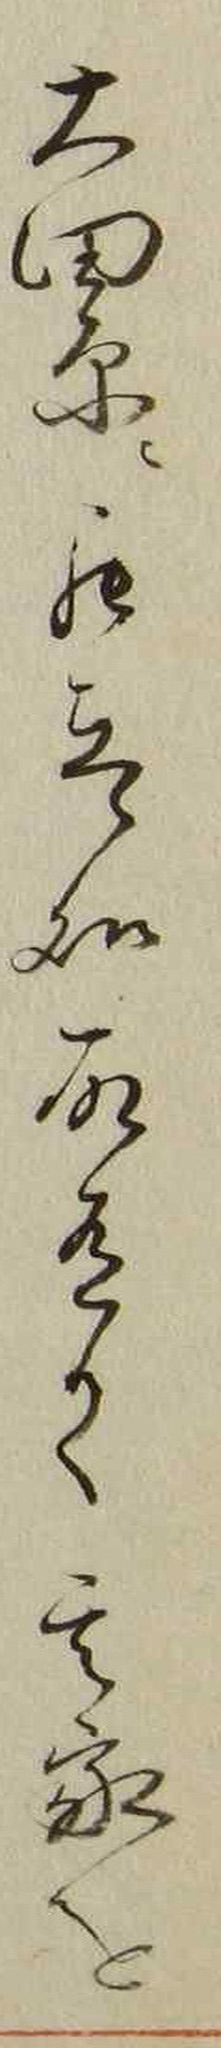大田原ニ罷在候処故有て其家を
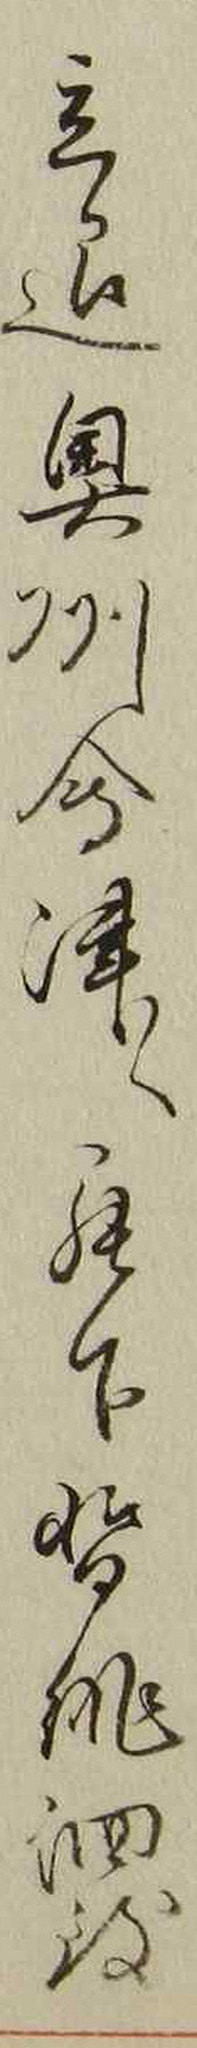立退奥州会津へ罷下暫徘徊致
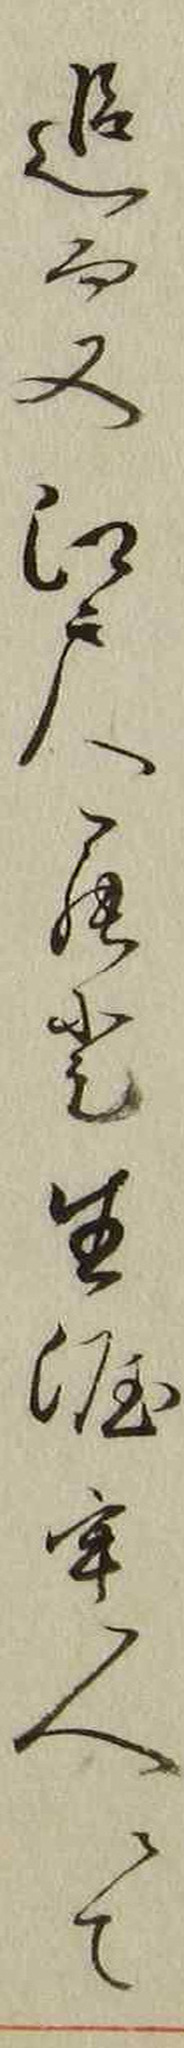追而又江戸へ罷登生涯牢人ニて
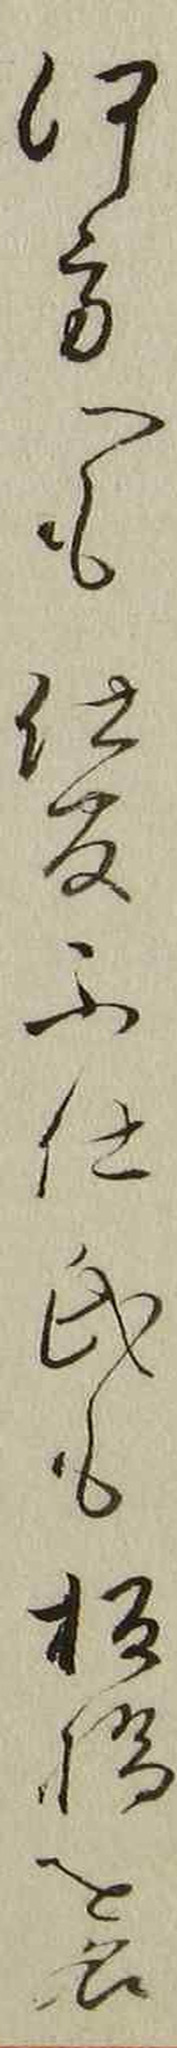何方へも仕官不仕氏も板橋を名
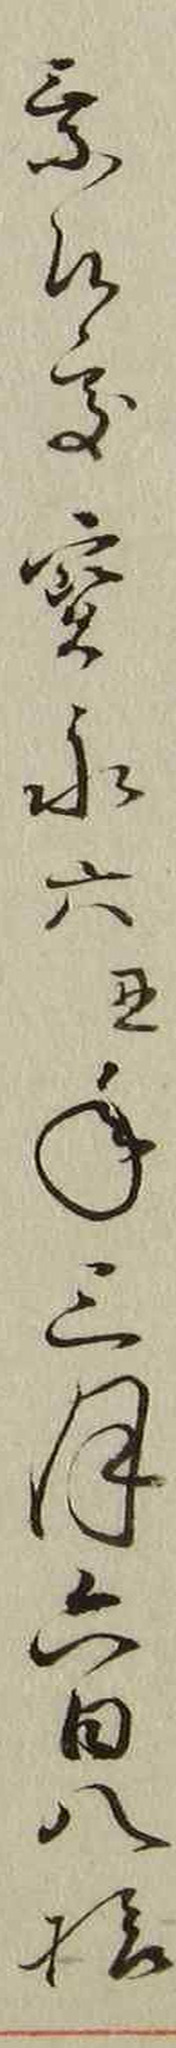乗候処宝永六丑年三月六日八拾
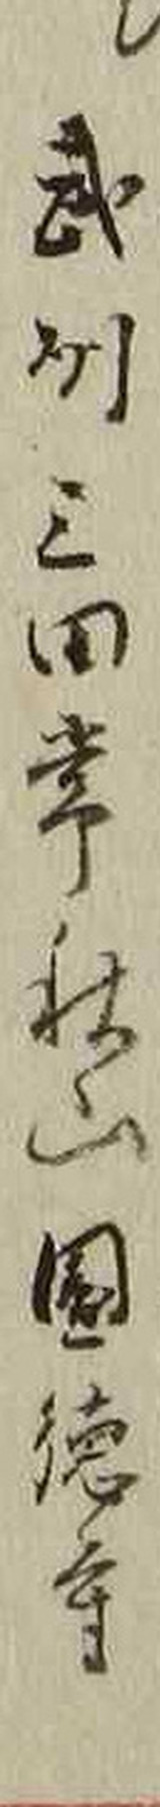武州三田常秋山円徳寺
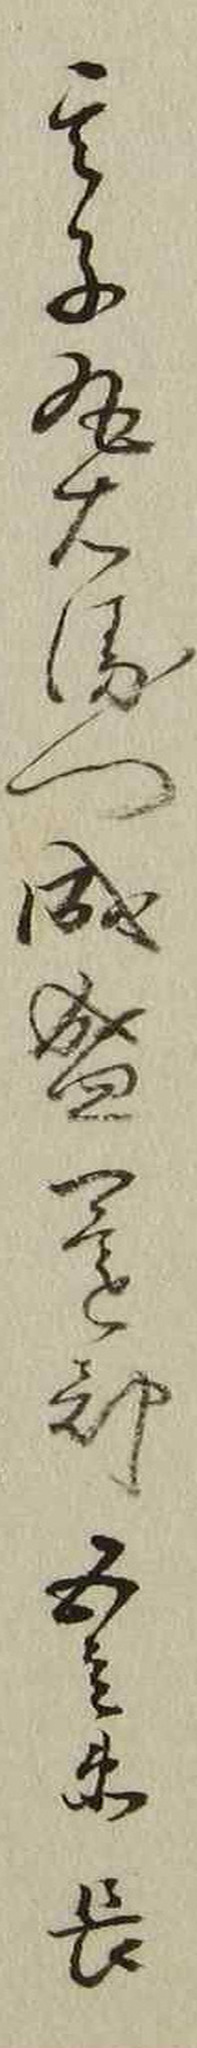其子丸右衛門成盛園部五兵衛長
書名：諸士系譜　巻之4　い之部4
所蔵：会津若松市立会津図書館
